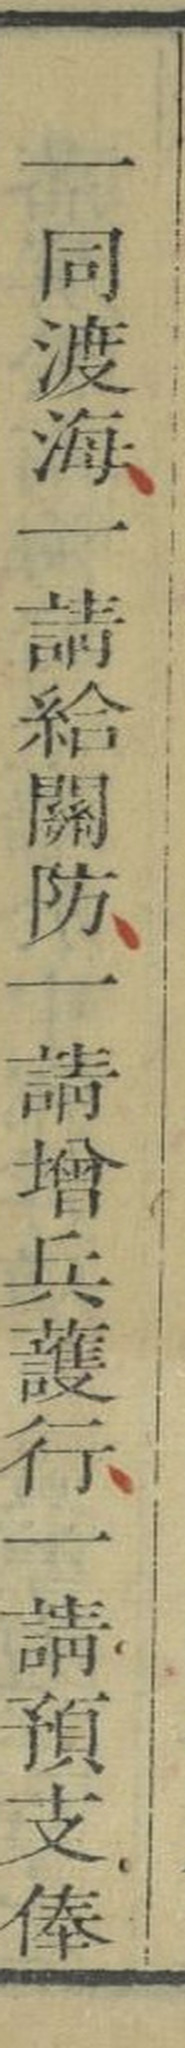一同渡海一請給関防一請増兵護行一請預支俸
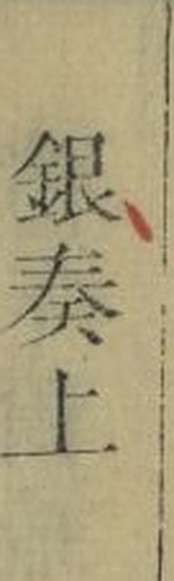銀奏上
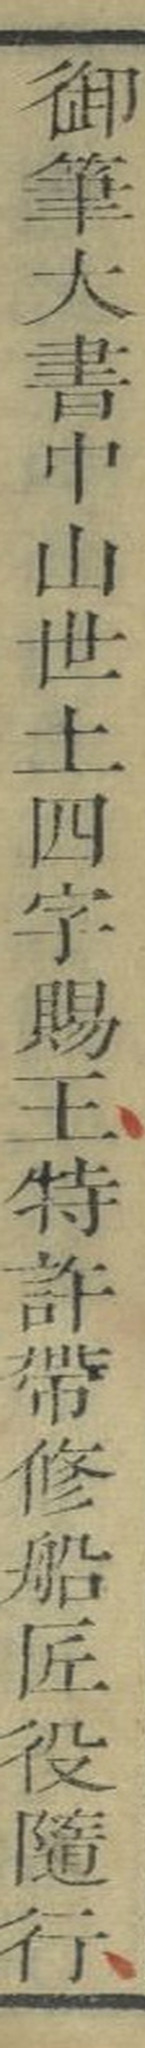御筆大書中山世土四字賜王特許帯修船匠役随行
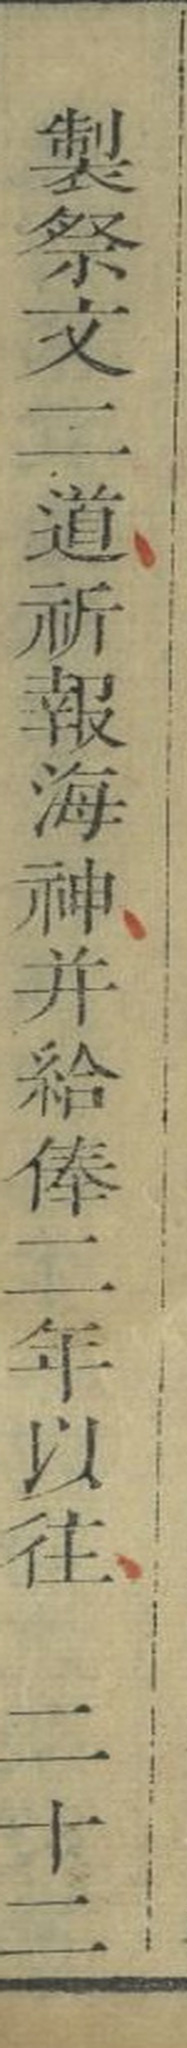製祭文二道祈報海神幷給俸二年以往二十二
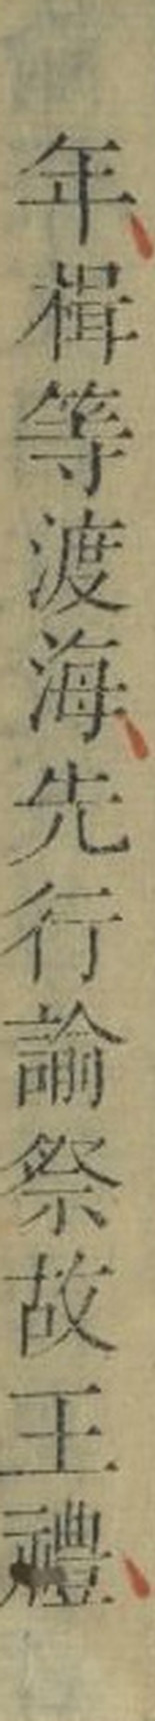年楫等渡海先行諭祭故王礼

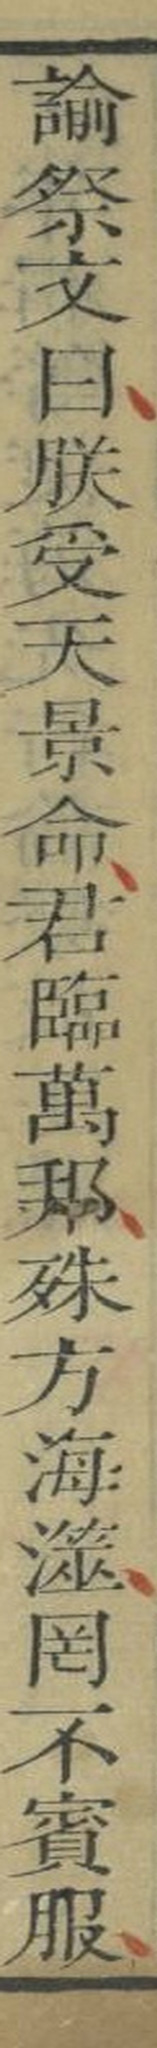諭祭文曰朕受天景命君臨万邦殊方海澨罔不賓服
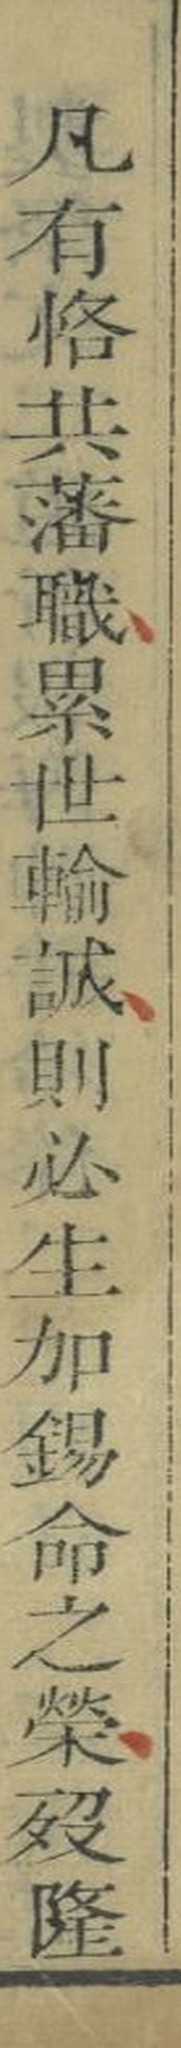凡有恪共藩職累世輸誠則必生加錫命之栄歿隆
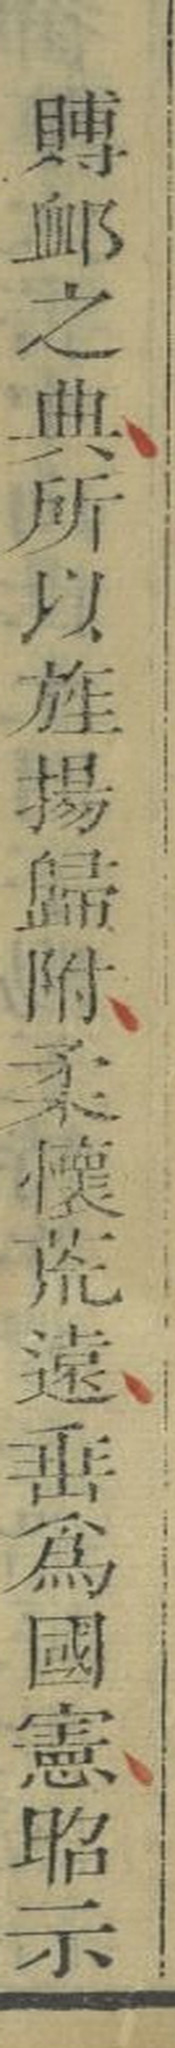賻恤之典所以旌揚帰附柔懐荒遠垂為国憲昭示
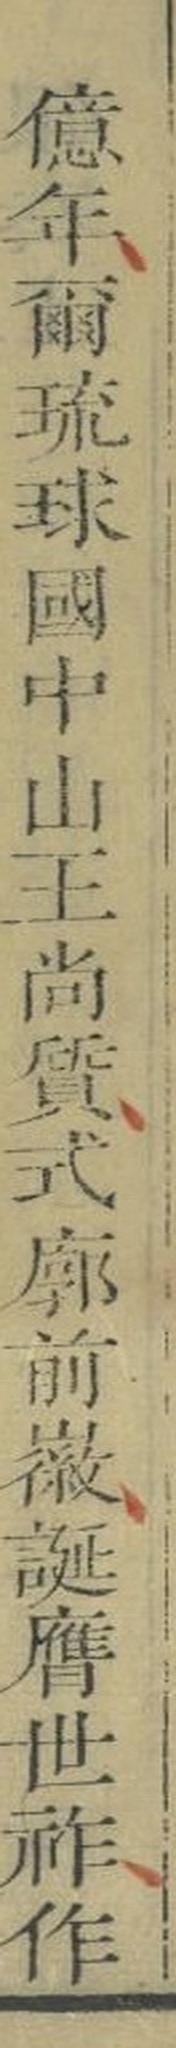億年爾琉球国中山王尚質式廓前徽誕膺世祚作
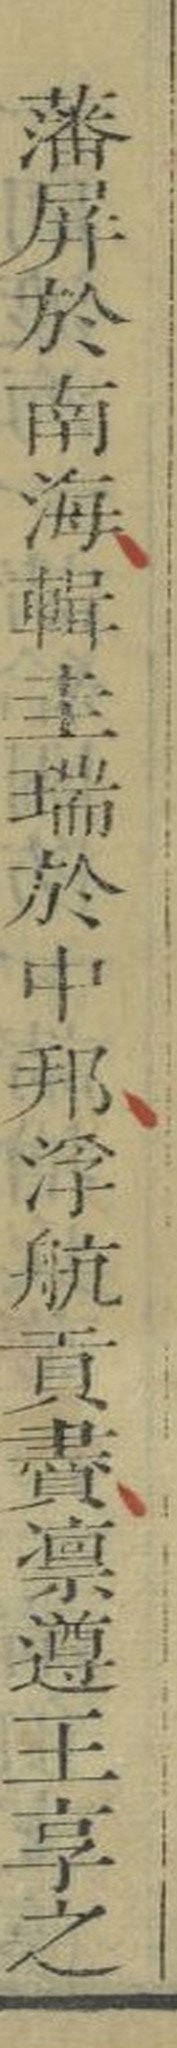藩屏於南海輯圭瑞於中邦浮航貢賮凜遵王享之
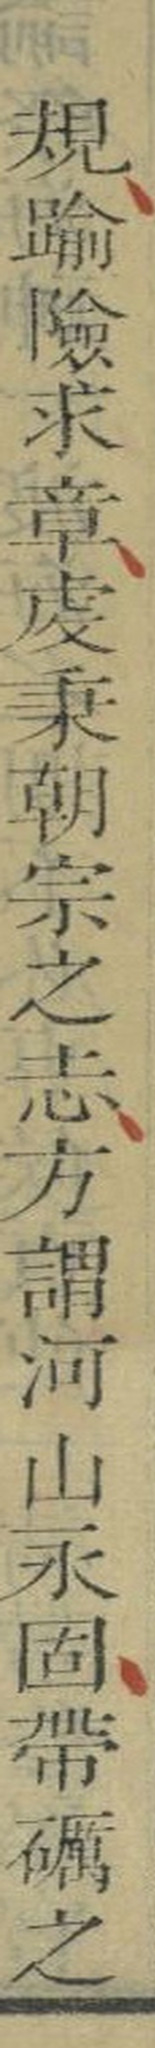規踰険求章虔秉朝宗之志方謂河山永固帯礪之
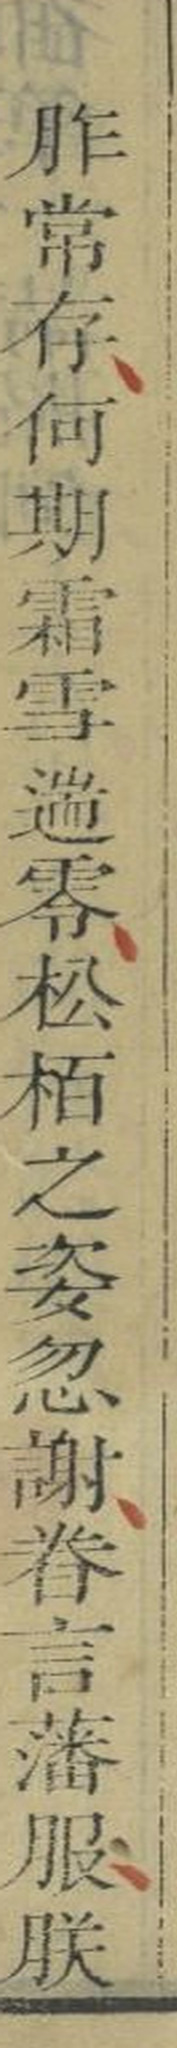胙常存何期霜雪遄零松柏之姿忽謝眷言藩服朕
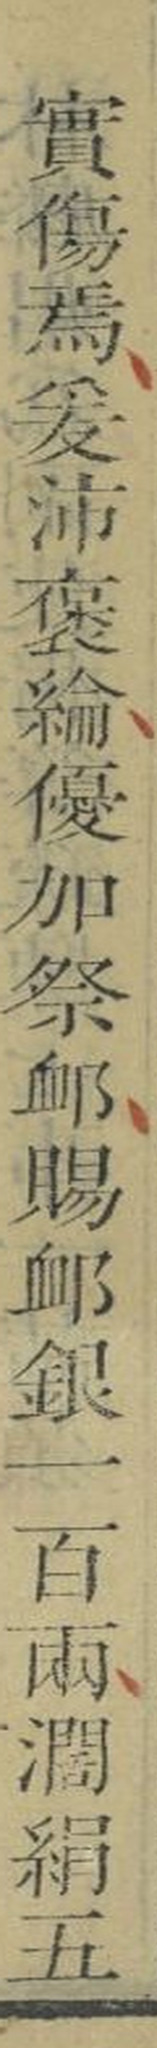実傷焉爰沛褒綸優加祭恤賜恤銀一百両濶絹五
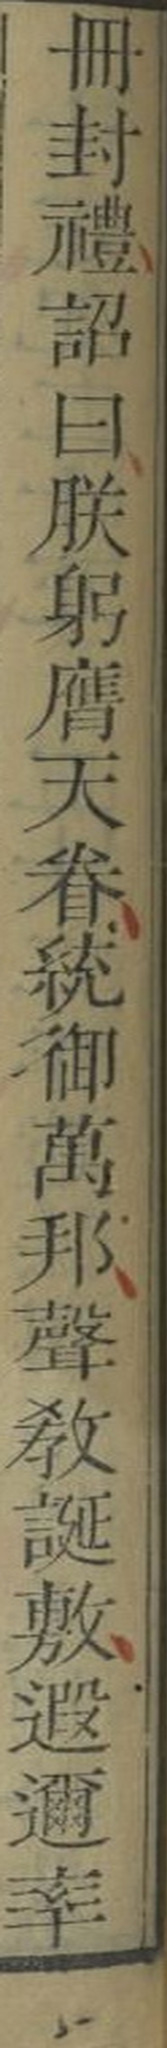冊封礼詔曰朕躬膺天眷統御万邦声教誕敷遐邇率
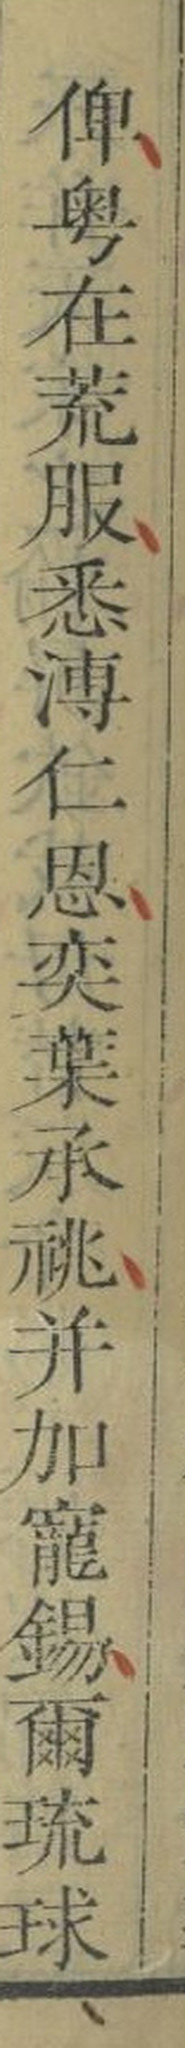俾粤在荒服悉溥仁恩奕葉承祧并加寵錫爾琉球
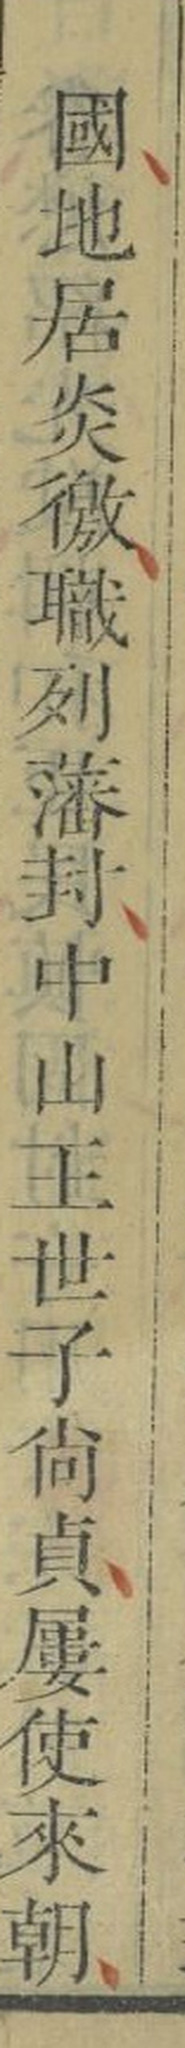国地居炎徼職列藩封中山王世子尚貞屢使来朝
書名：中山伝信録 巻三
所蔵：University of the Ryukyus Library
